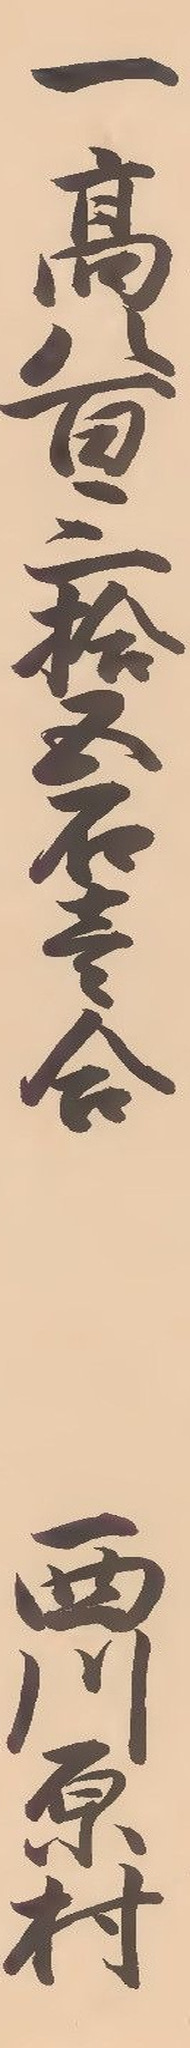一髙八百三拾五石壱合西川原村
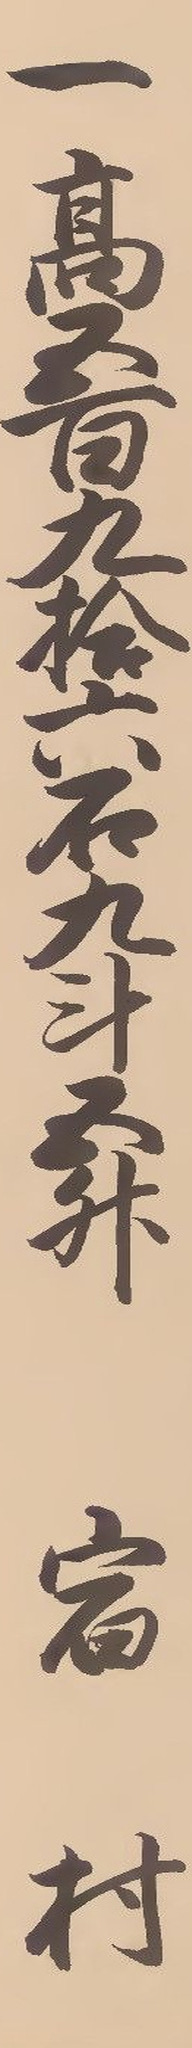一髙五百九拾六石九斗五升宿村
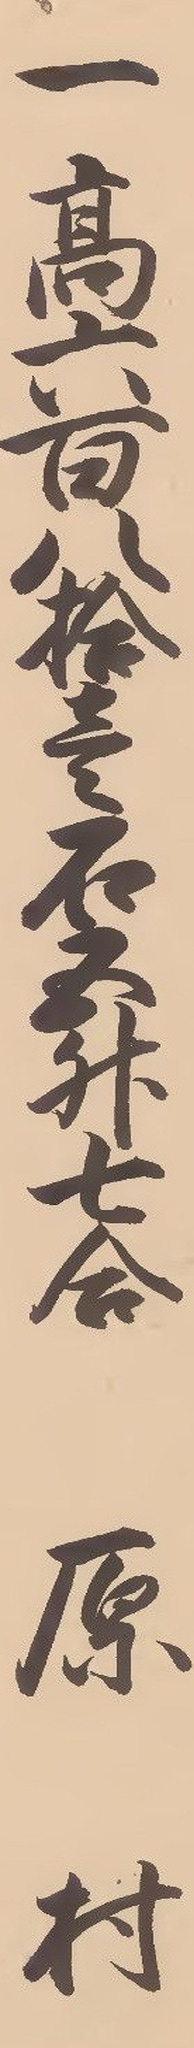一髙六百八拾壱石五升七合原村
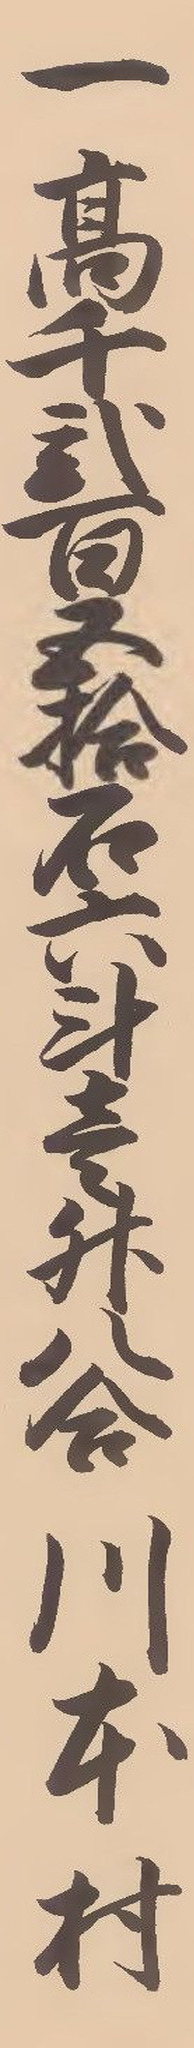一髙千弐百五拾石六斗壱升八合川本村
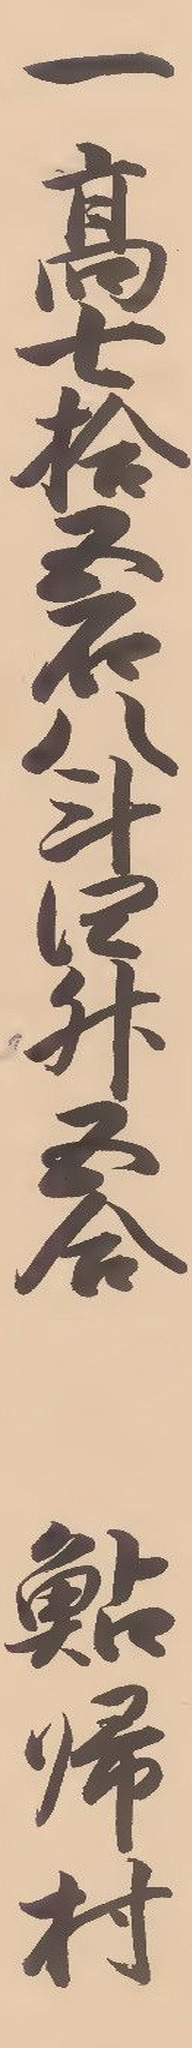一髙七拾五石八斗四升五合鮎帰村

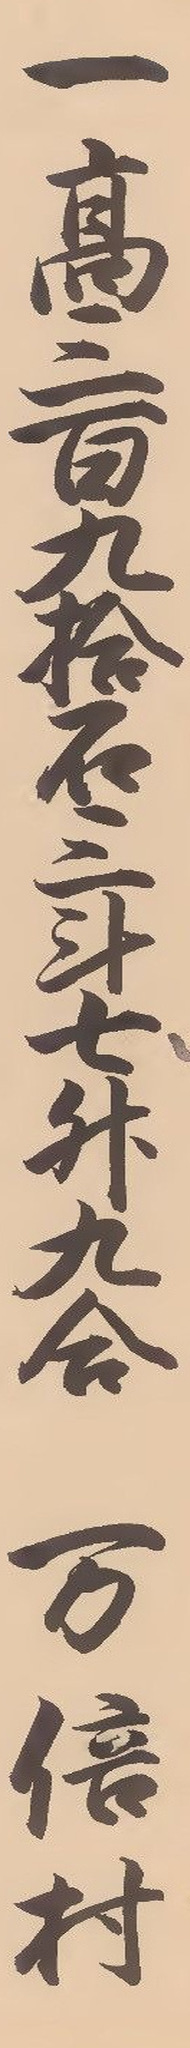一髙三百九拾石三斗七升九合万倍村
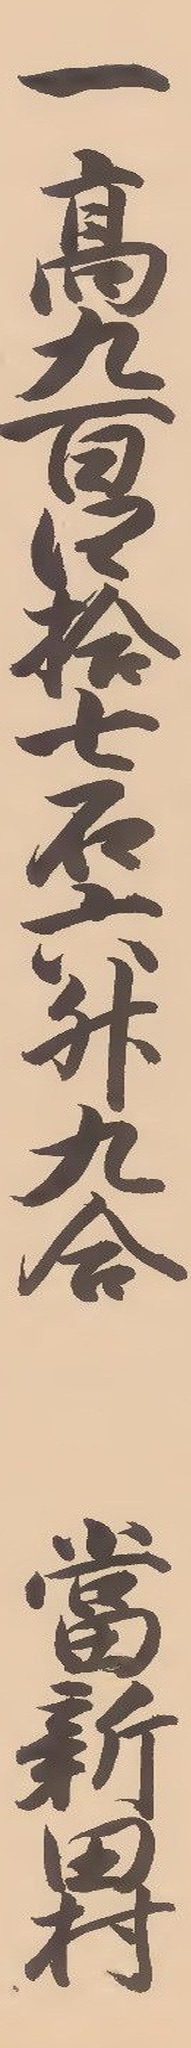一髙九百四拾七石六升九合當新田村
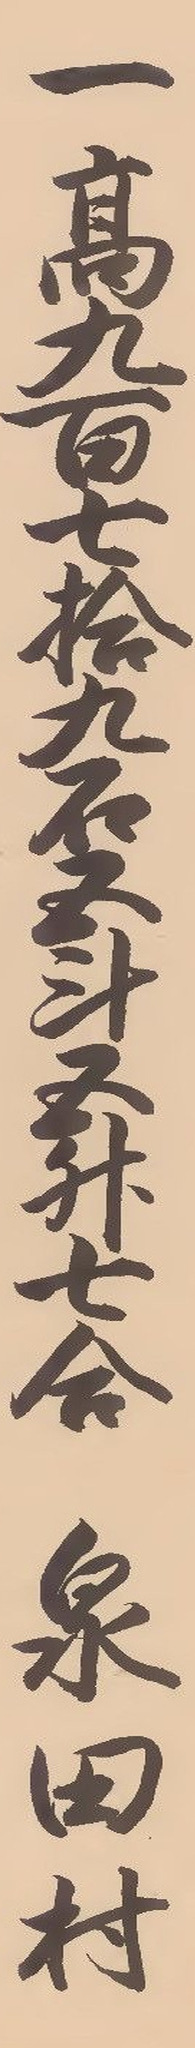一髙九百七拾九石五斗五升七合泉田村
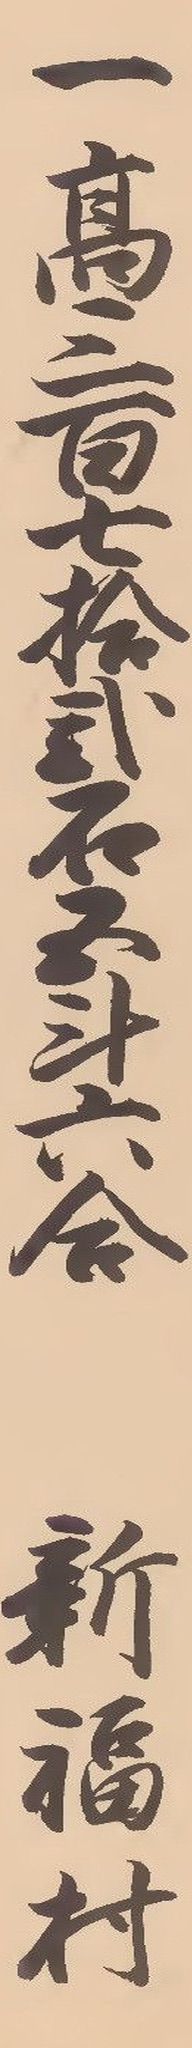一髙三百七拾弐石五斗六合新福村
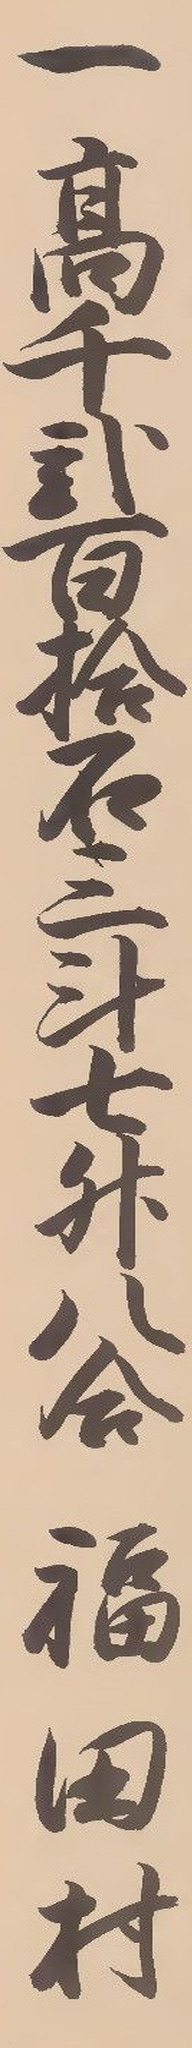一髙千弐百拾石三斗七升八合福田村
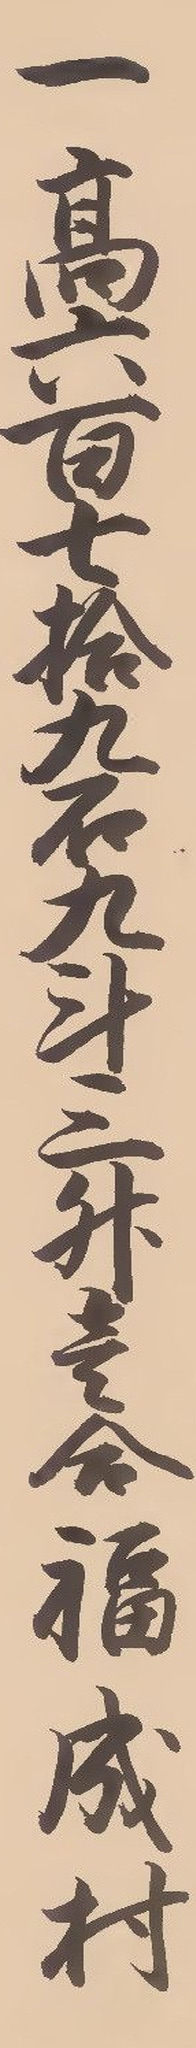一髙六百七拾九石九斗三升壱合福成村
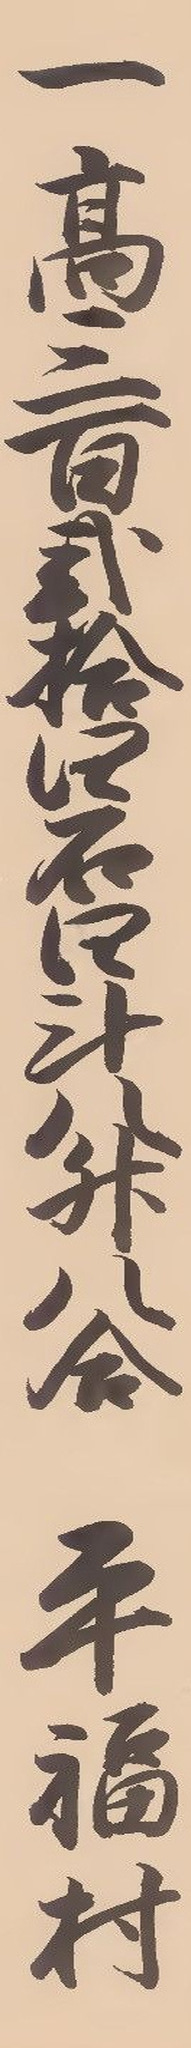一髙三百弐拾四石四斗八升八合平福村
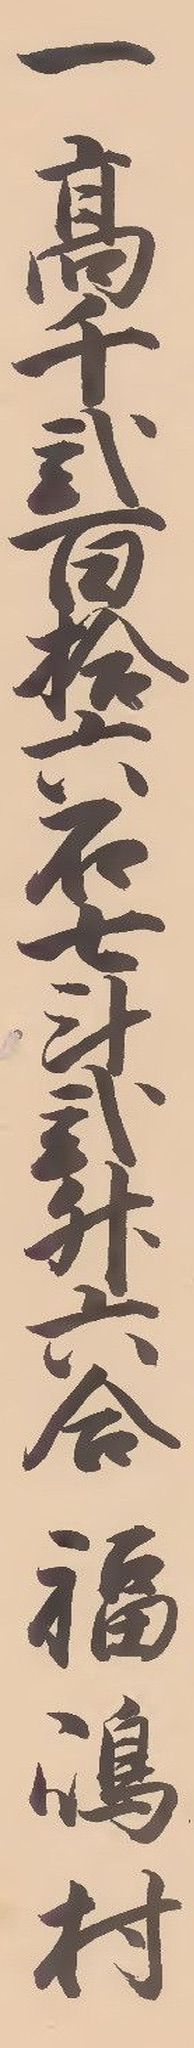一髙千弐百拾六石七斗弐升六合福嶋村

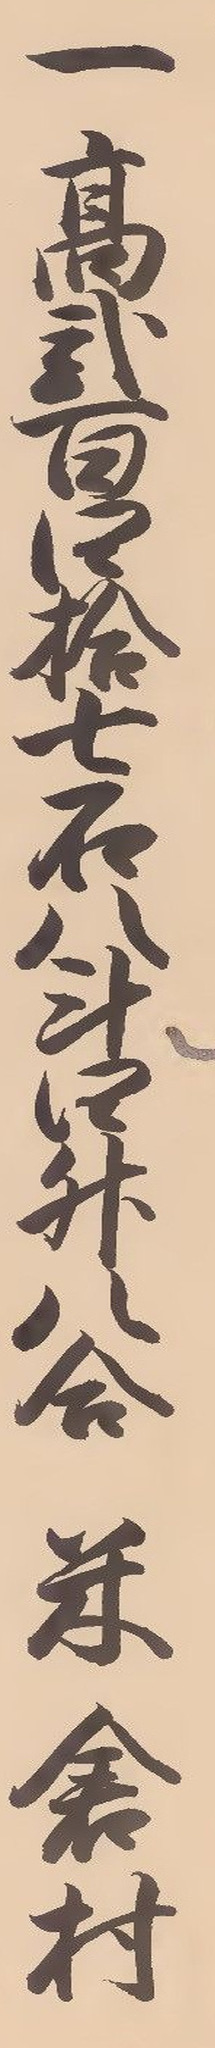一髙弐百四拾七石八斗四升八合米倉村
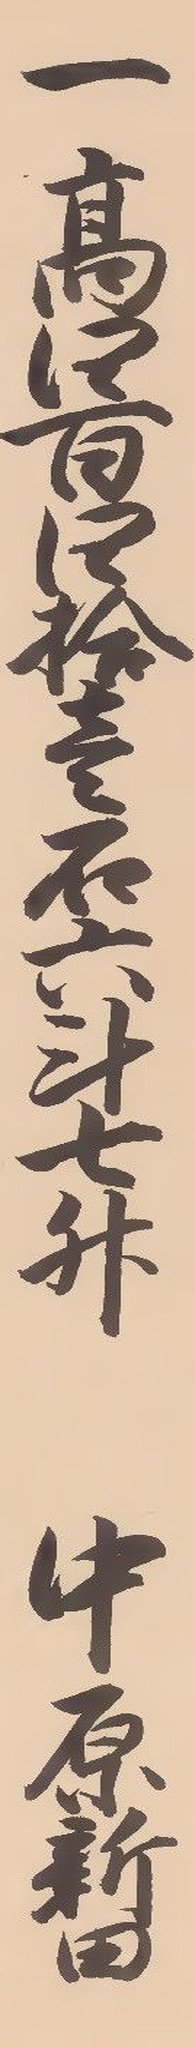一髙四百四拾壱石六斗七升中原新田
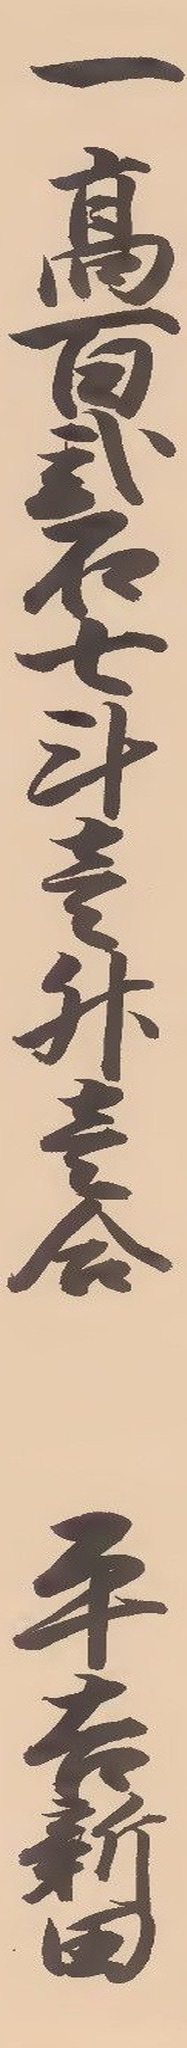一髙百弐石七斗壱升壱合平吉新田
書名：備前国郷帳
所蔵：国立公文書館 National Archives of Japan
